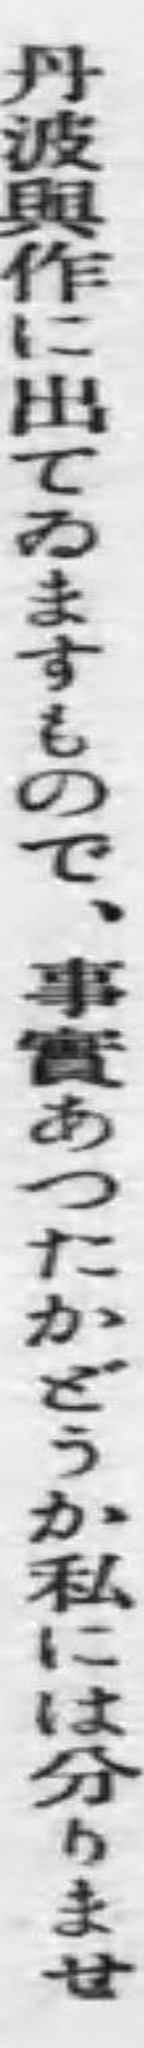丹波与作に出てゐますもので、事実あつたかどうか私には分りませ
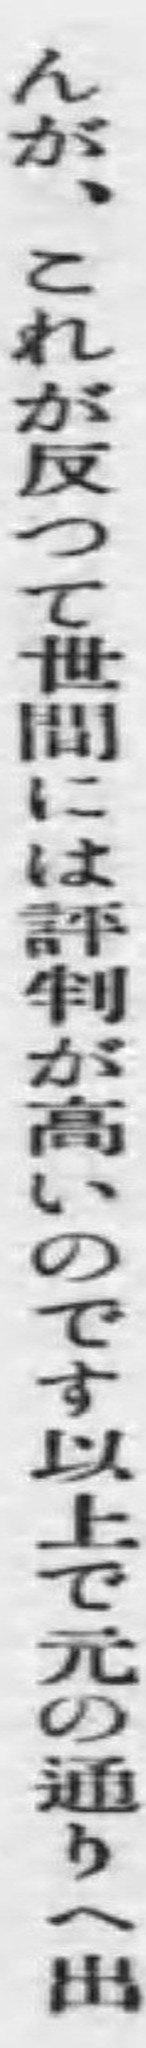んが、これが反つて世間には評判が高いのです以上で元の通りへ出
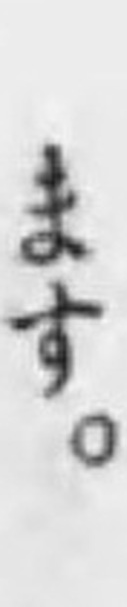ます。
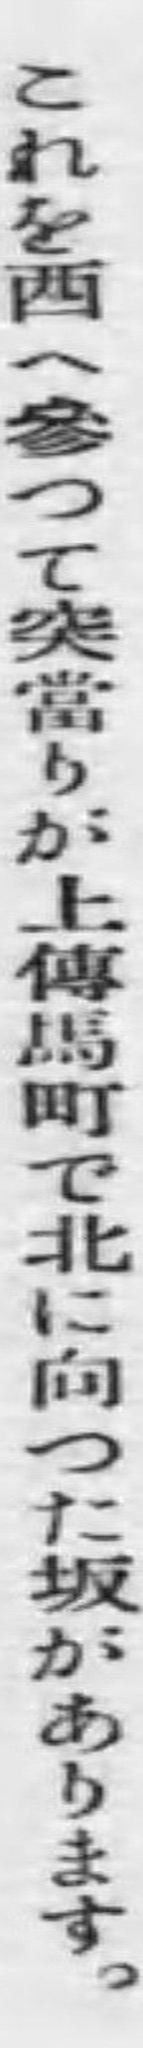これを西へ参つて突当りが上伝馬町で北に向つた坂があります。
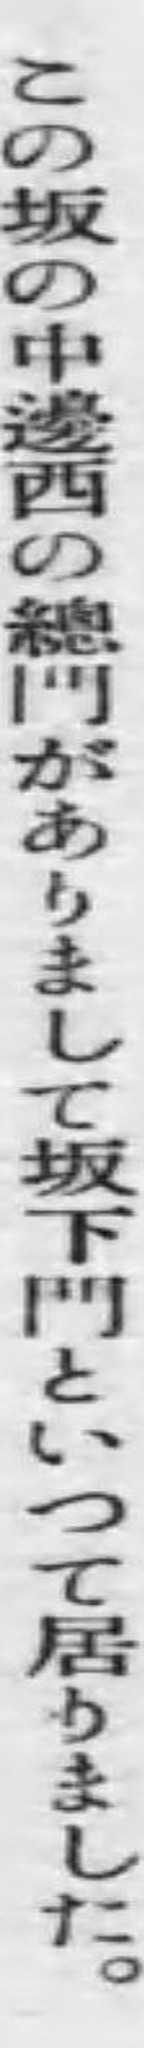この坂の中辺西の総門がありまして坂下門といつて居りました。
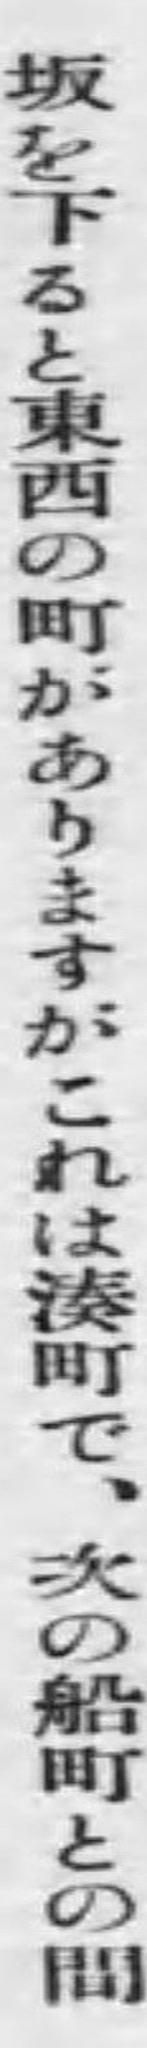坂を下ると東西の町がありますがこれは湊町で、次の船町との間
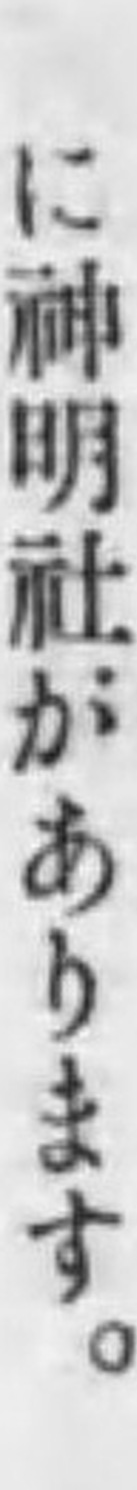に神明社があります。
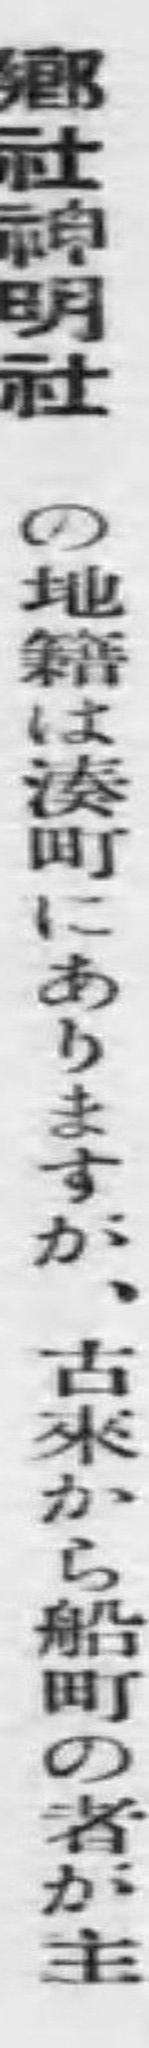郷社神明社の地籍は湊町にありますが、古来から船町の者が主
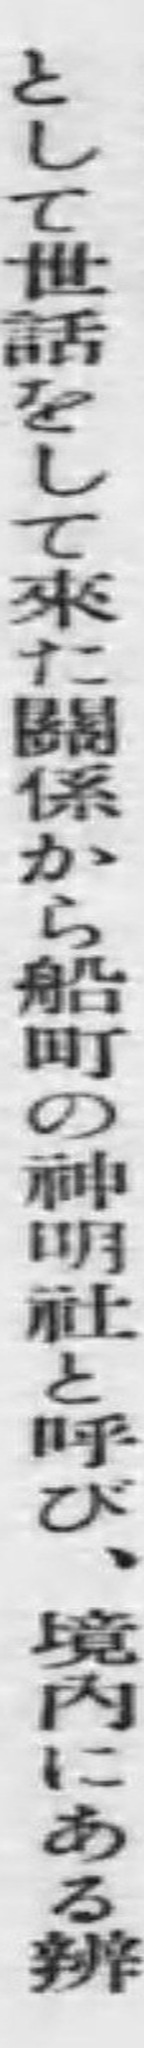として世話をして来た関係から船町の神明社と呼び、境内にある弁
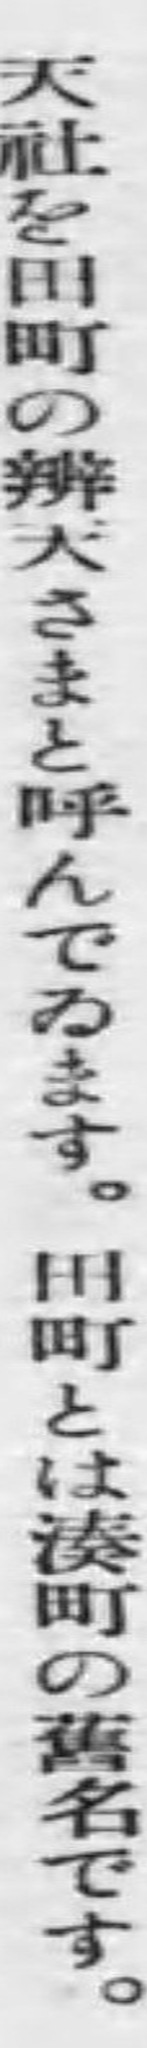天社を田町の弁天さまと呼んでゐます。田町とは湊町の旧名です。
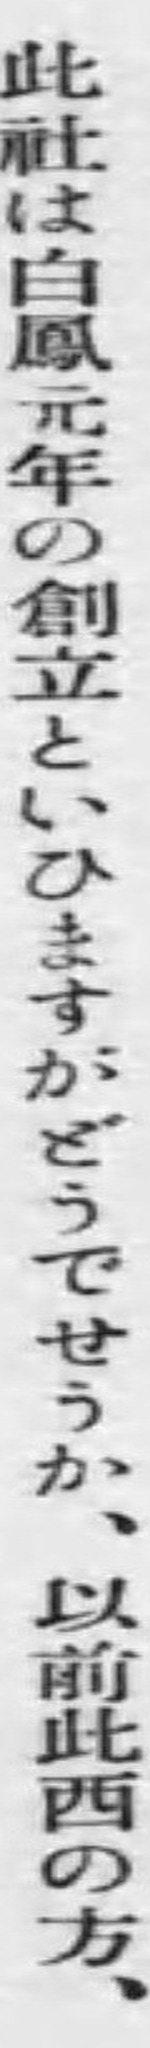此社は白鳳元年の創立といひますがどうでせうか、以前此西の方、
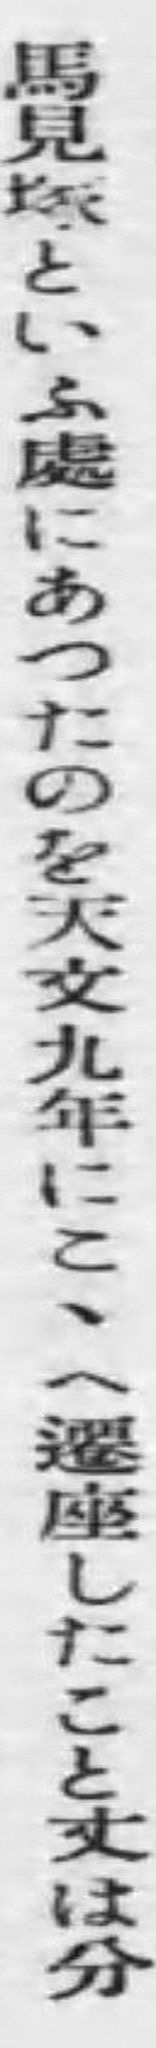馬見塚といふ処にあつたのを天文九年にこゝへ遷座したこと丈は分
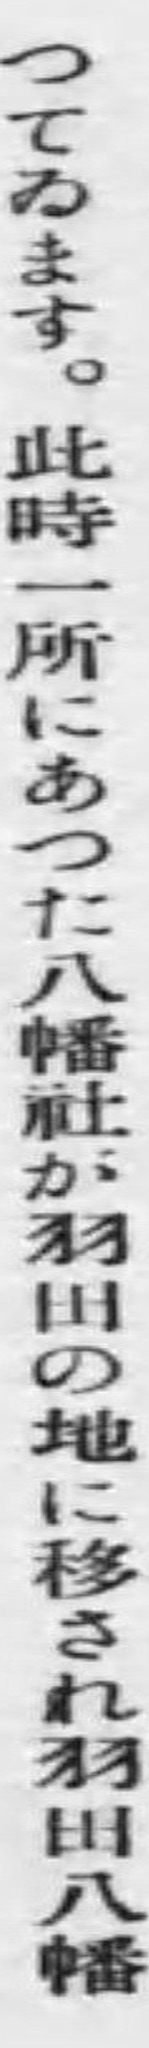つてゐます。此時一所にあつた八幡社が羽田の地に移され羽田八幡
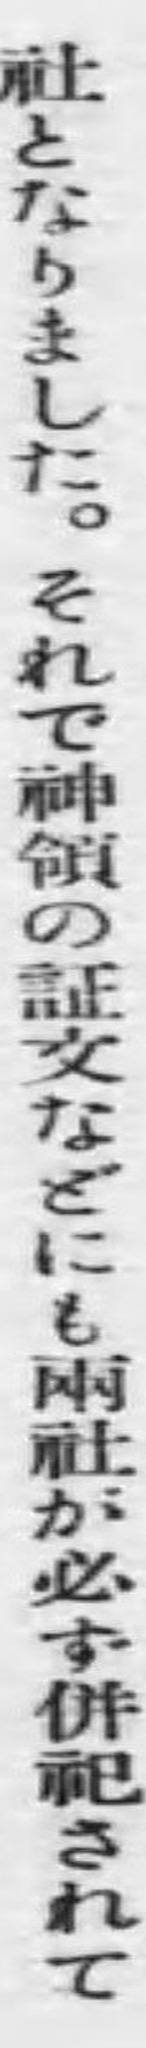社となりました。それで神領の証文などにも両社が必ず併祀されて
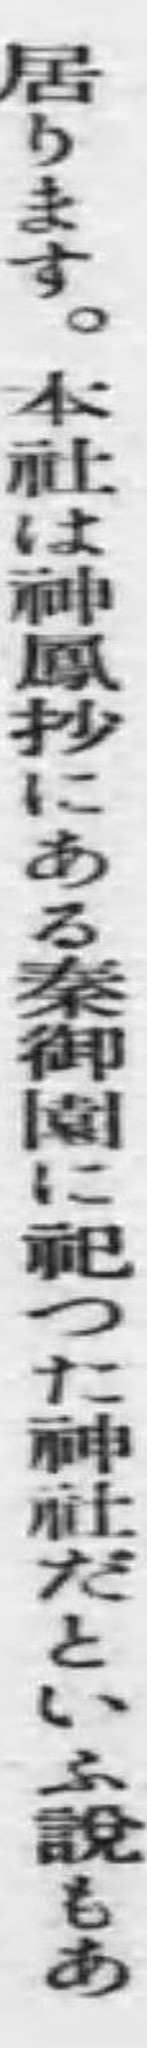居ります。本社は神鳳抄にある秦御園に祀つた神社だといふ説もあ
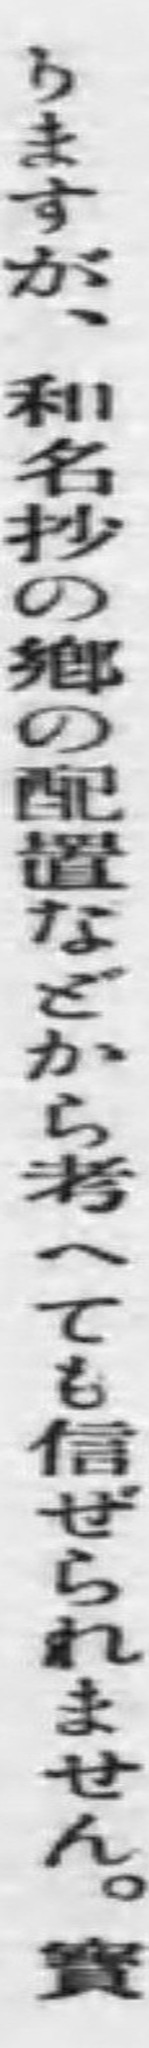りますが、和名抄の郷の配置などから考へても信ぜられません。宝
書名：東三河道中記 : 豊橋市及其附近案内
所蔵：国立国会図書館 National Diet Library, JAPAN
